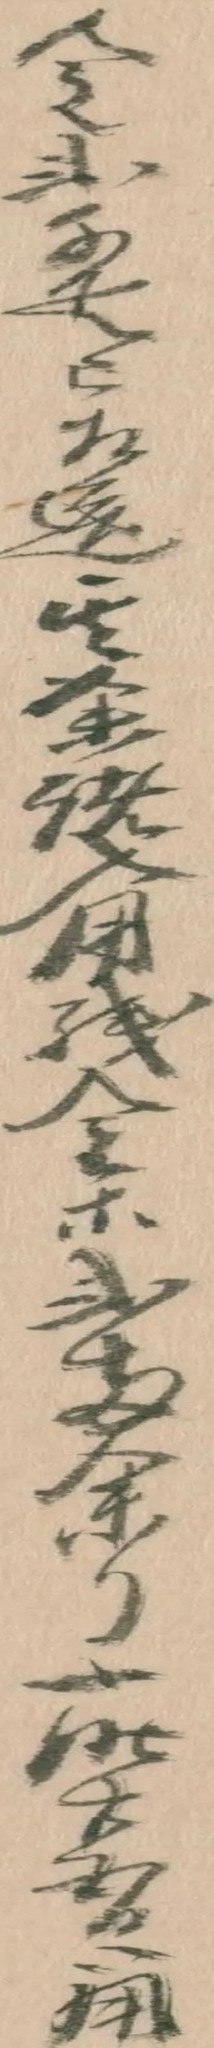金弐千疋被相送其余諸入用我金等弐両余り十時廿五日御用
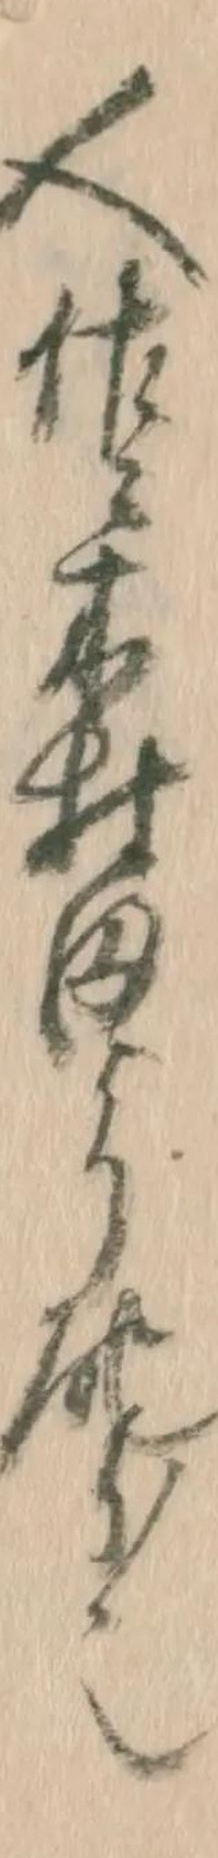人佐〻木村田より配分也
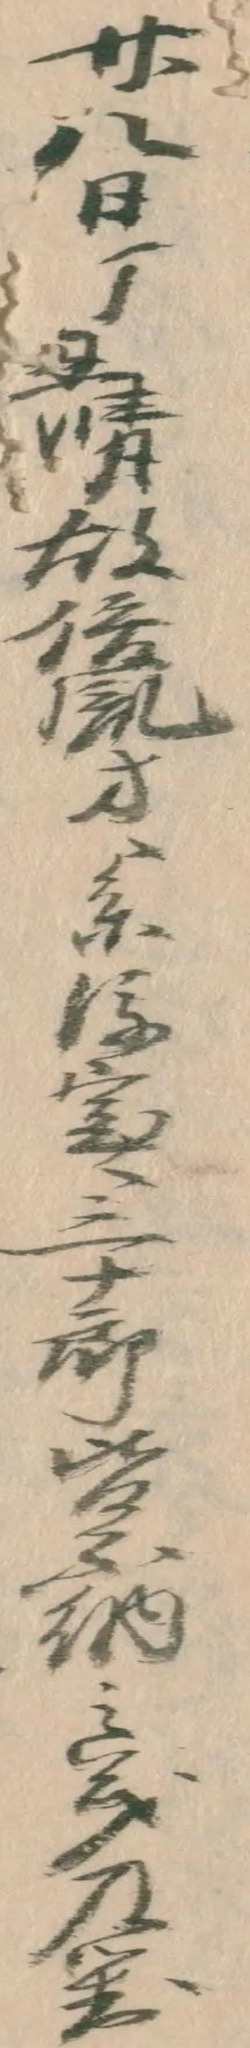廿八日丁丑故故俊胤方へ参後室へ三十郎皆不納之義及
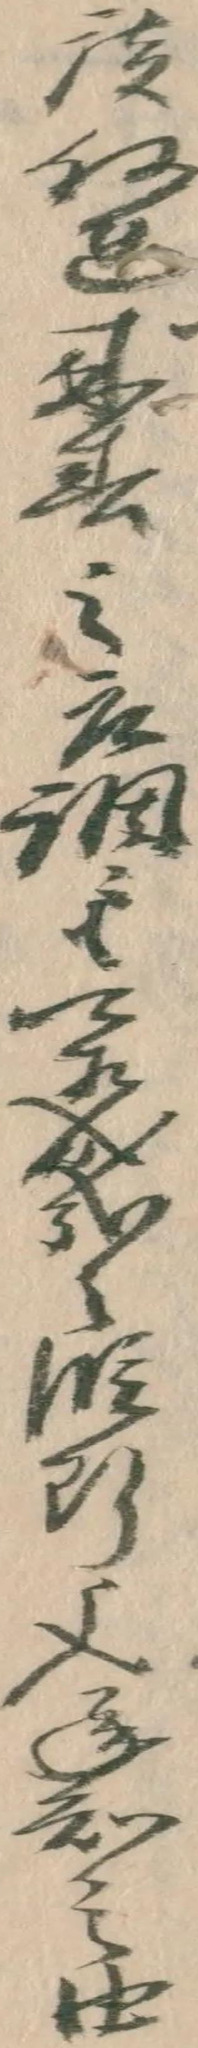請何れ来春之取調にも可相成哉之段断申入承知之由
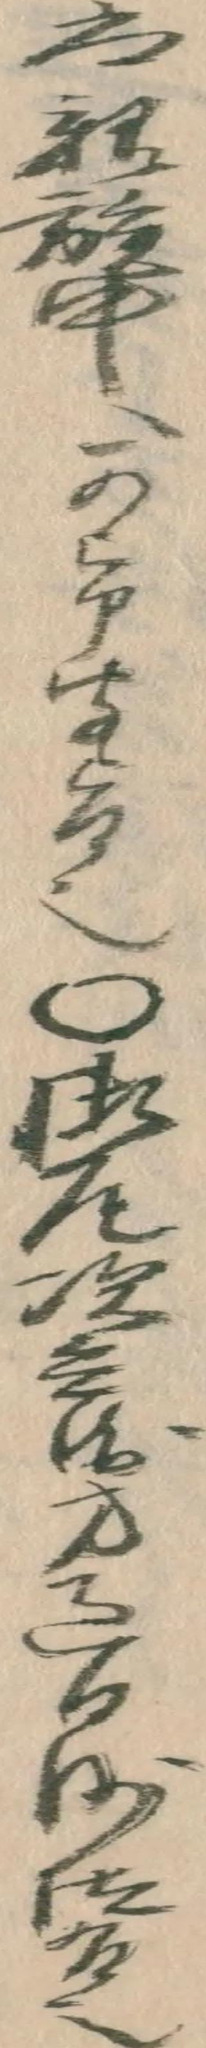尚親族中へ可被申聞旨也○瀬尾次兵衛方過日沙汰有之
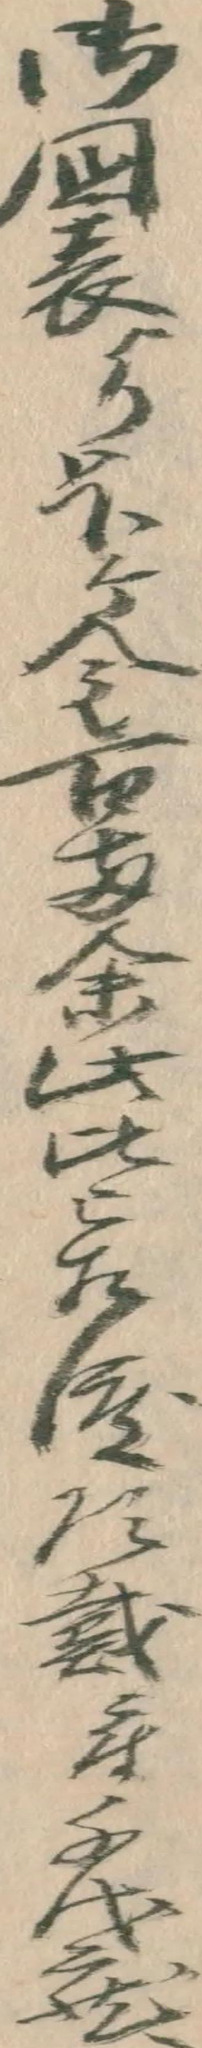御国表より被下ケ金百両余此比被相渡頂戴ニ付千代蔵
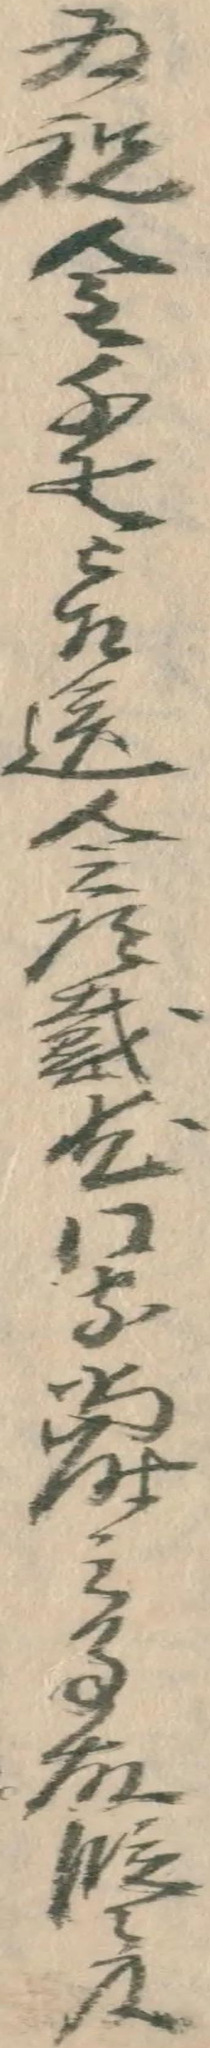為祝金千疋被相送令頂戴尤同家當時之事故段々及
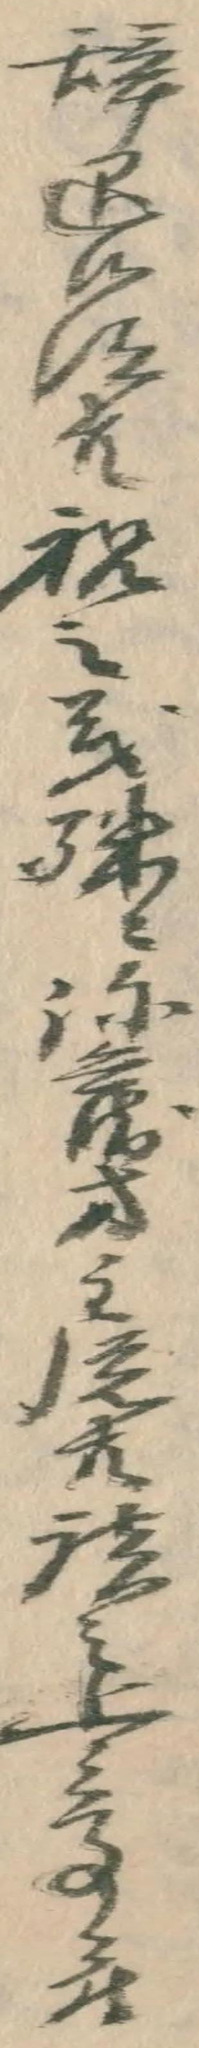辞退候得共祝之義殊ニ弥兵衛方主従共談之上之事ニ付
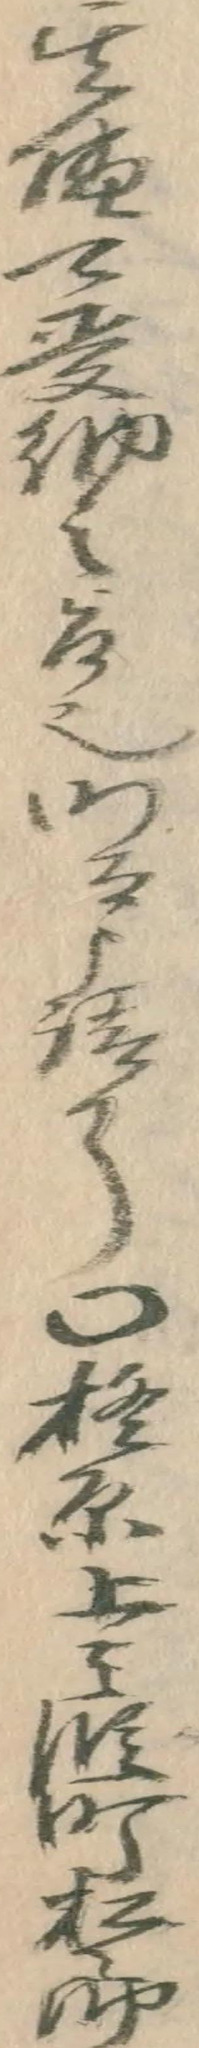其侭可受納之旨也仍而申請了◯柊原上之段町松之助

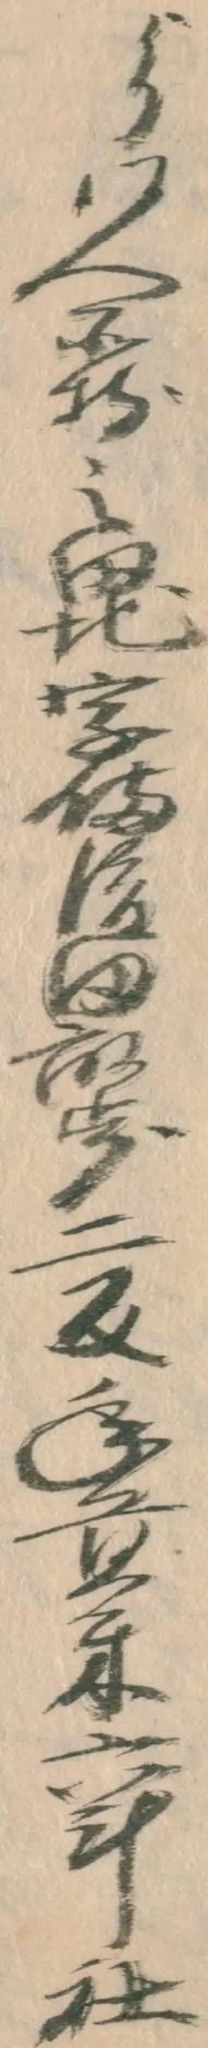より同人所持之田地字備後田畝歩二反年貢米六斗社
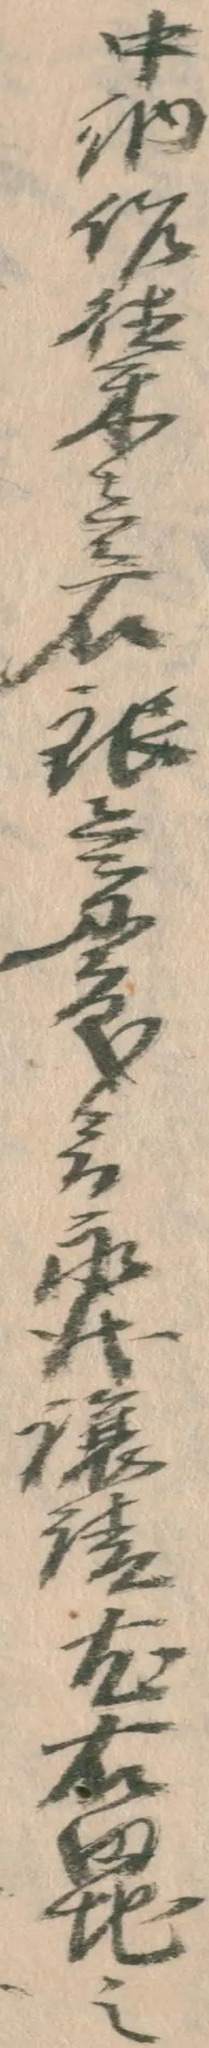中納作徳米壱石銀壱貫匁ニ而永代譲請尤右田地之
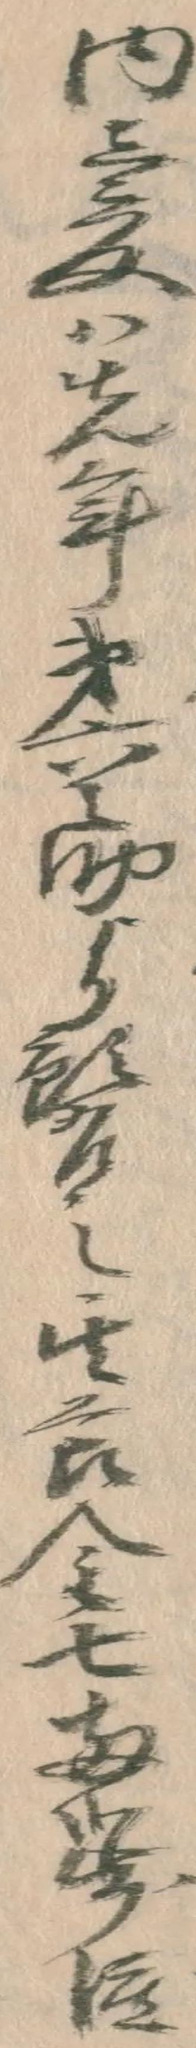内壱反ハ先年第六之助より預有之其節金七両弐歩渡
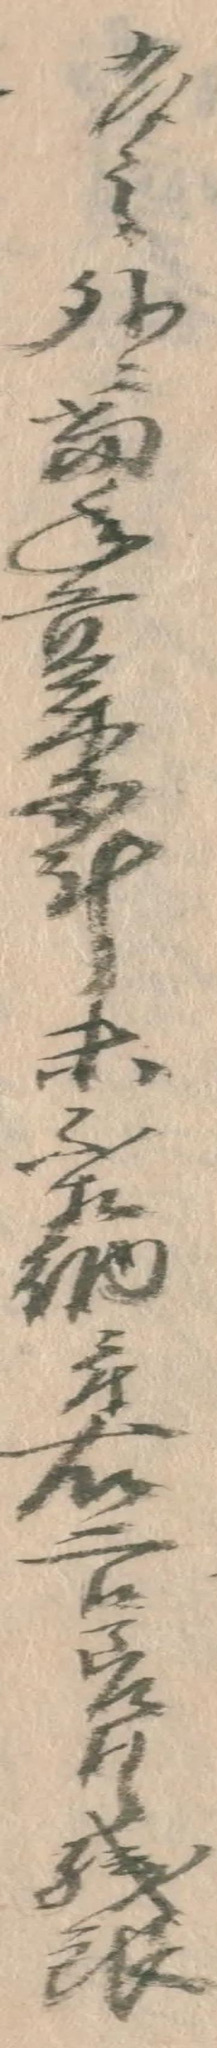有之外ニ當年貢米五斗未不相納ニ付右二日差引残銀
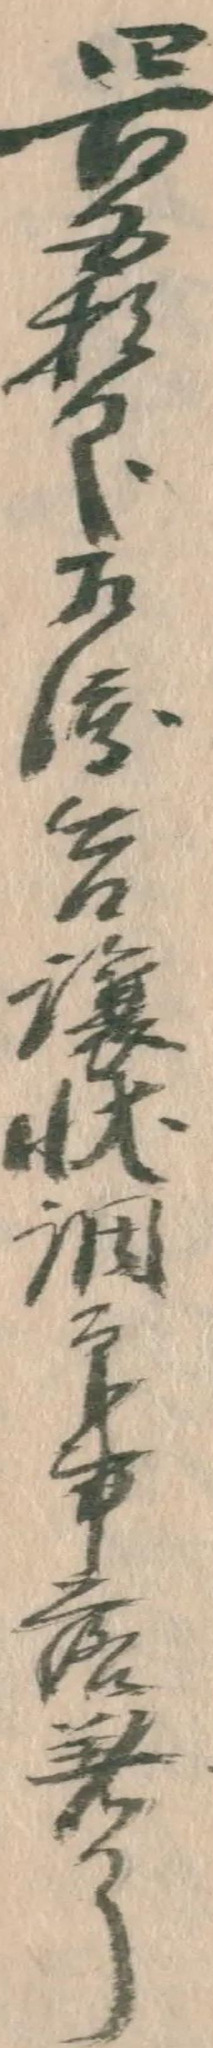四百五拾匁相渡今日譲状調印事落着了
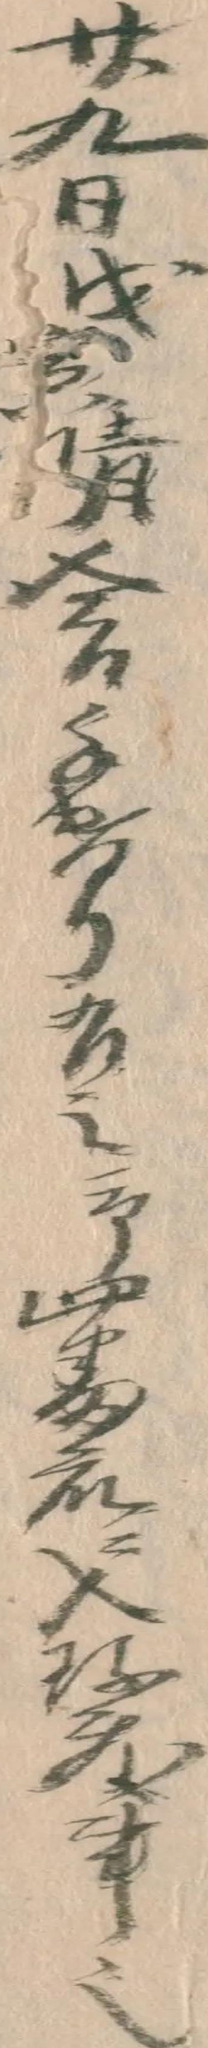廿九日戊寅晴今日手替り有之予四番衆ニ入珍度事也
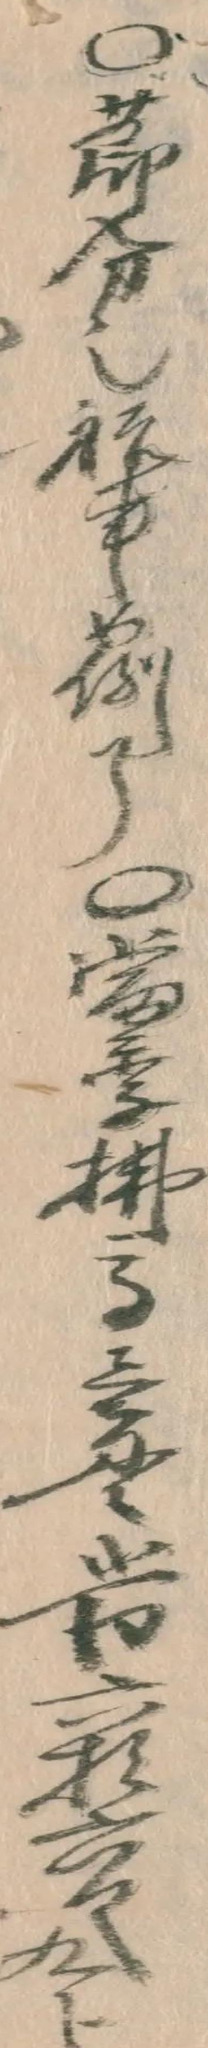○節分也祝事如例了○當季払高壱貫弐百六拾六匁九分
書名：賀茂社記録. 第67冊
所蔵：国立国会図書館 National Diet Library, JAPAN
